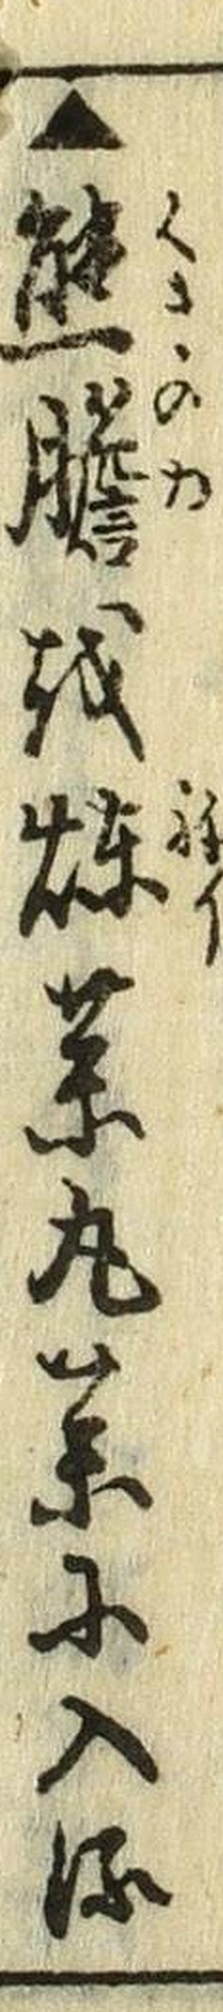▲熊胆を煉薬丸薬に入る
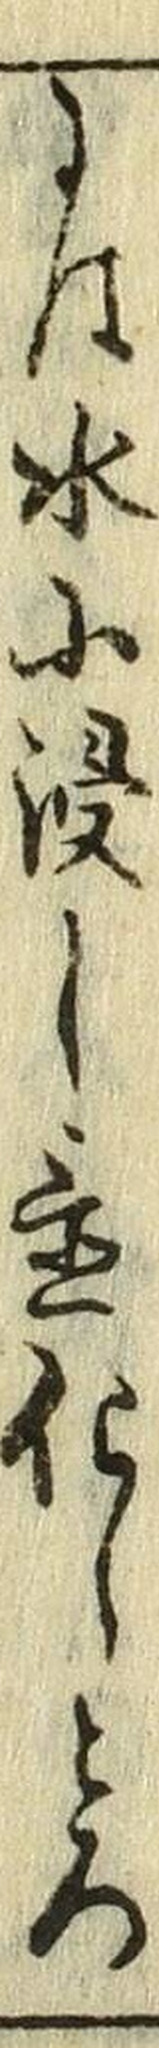には水に浸し置化しとろ
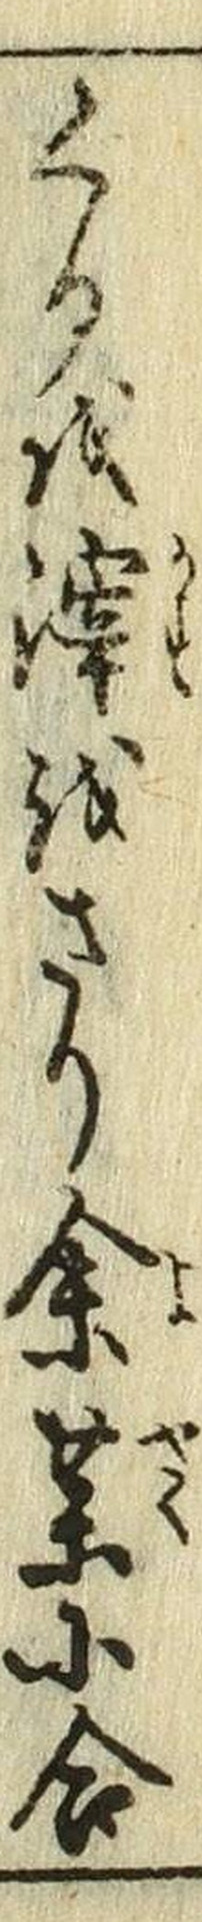くるを滓をさり余薬に合
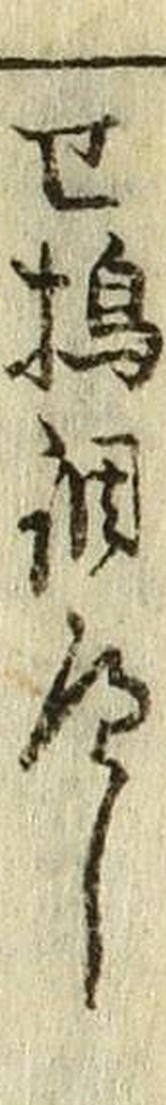せ搗調へし
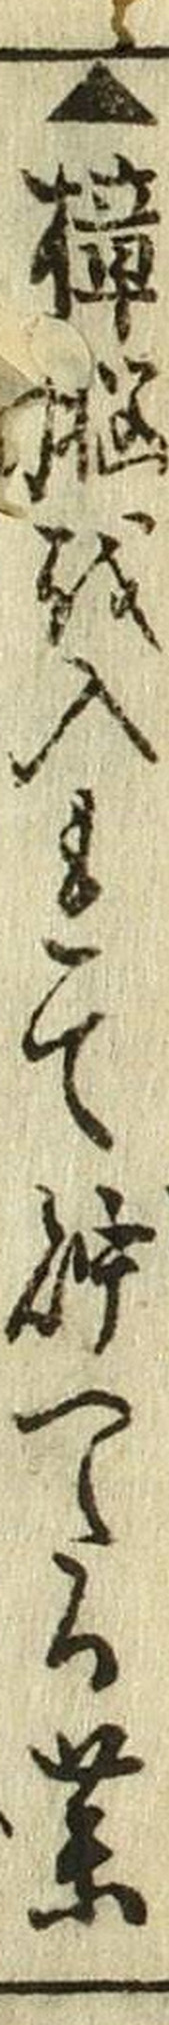▲樟脳を入れて貯へたる薬
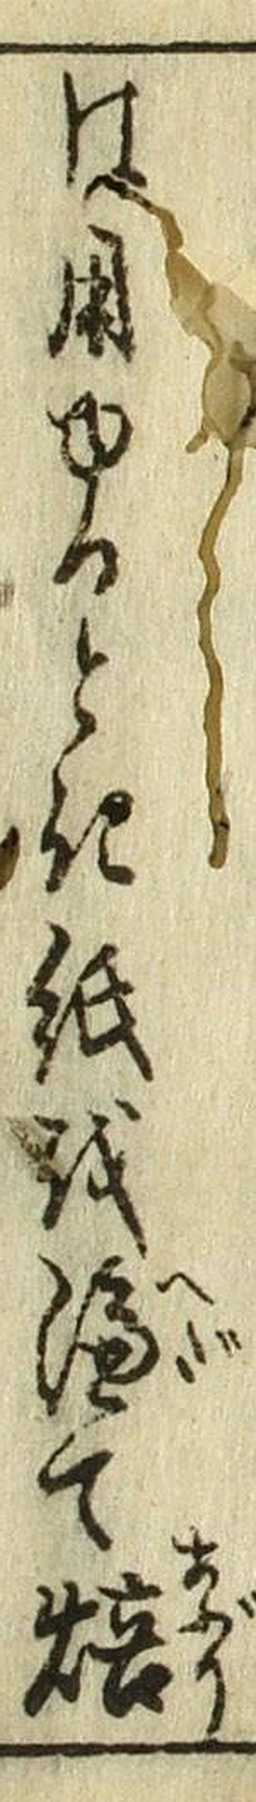は用ゆるとき紙を隔て焙
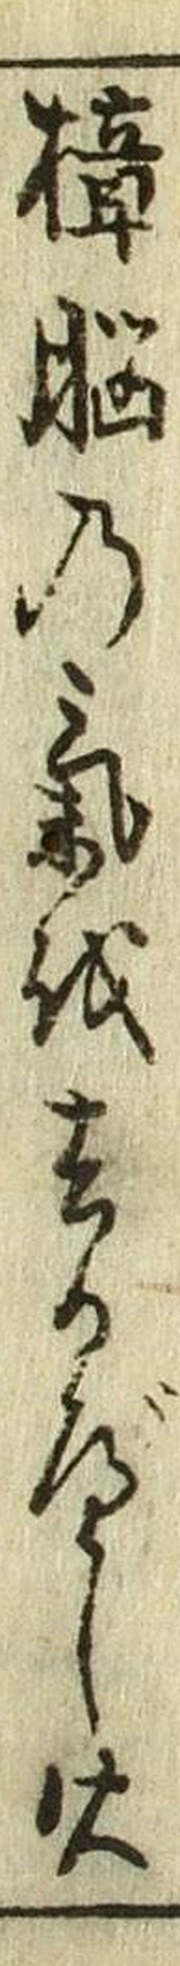樟脳の気を去るべし火
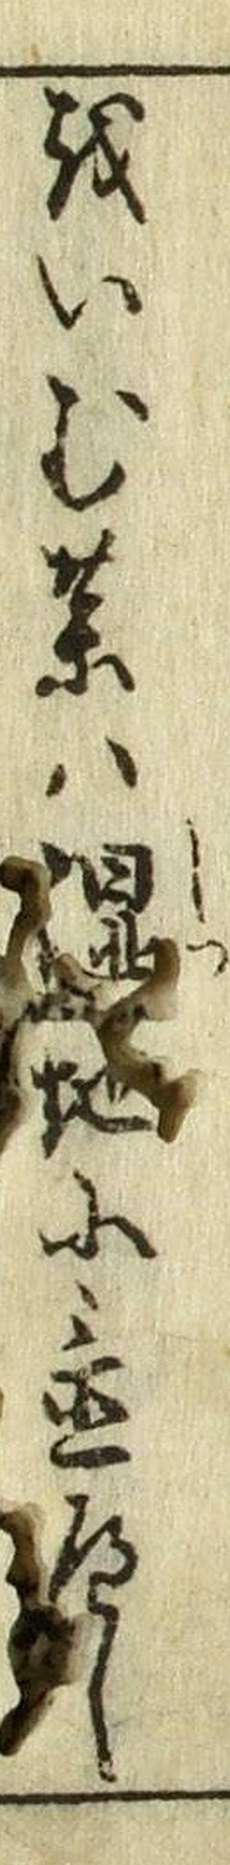をいむ薬は湿地に置へし
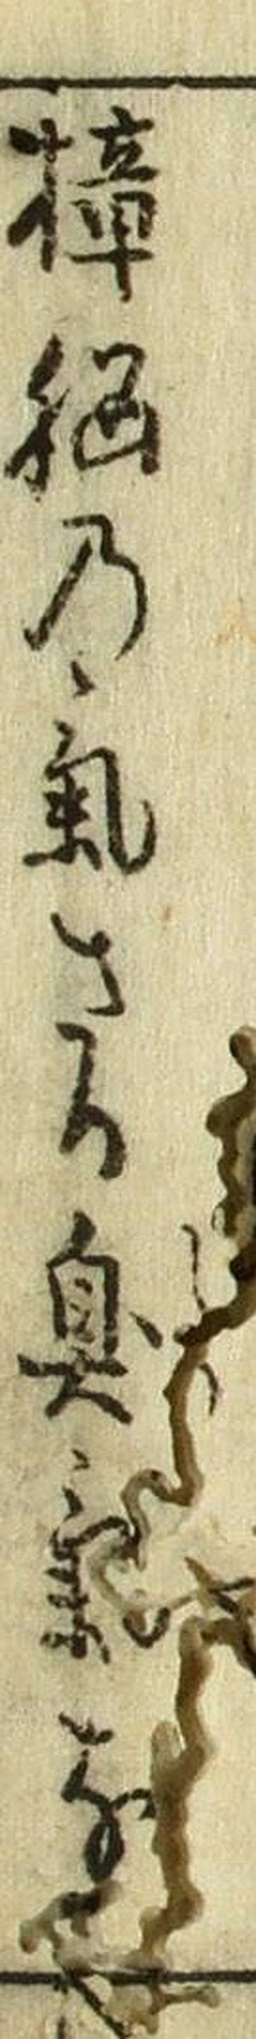樟脳の気さる臭気な

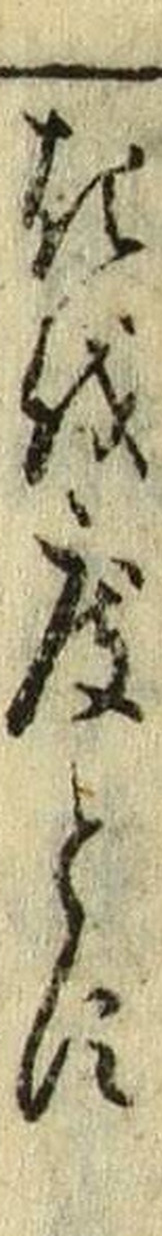きを度とす
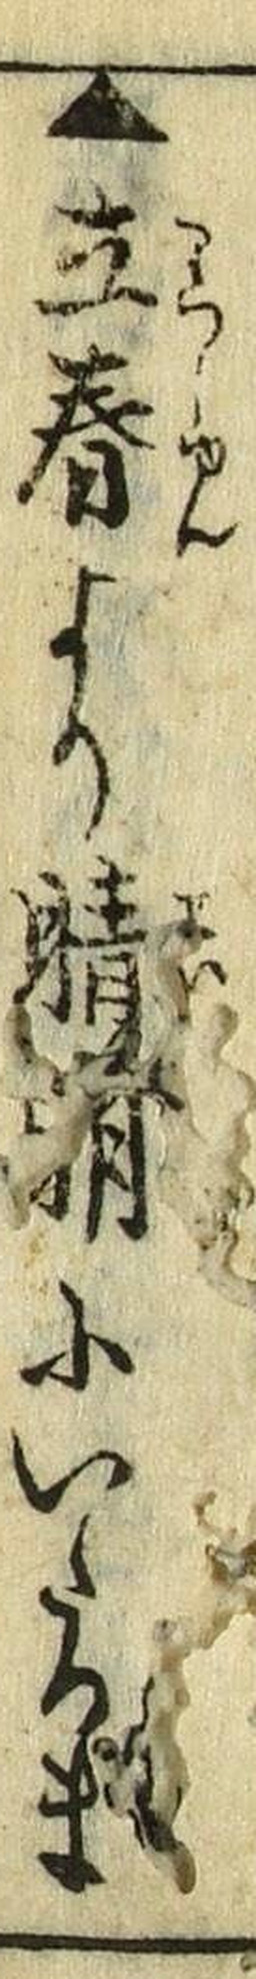▲立春より晴明にいたるま
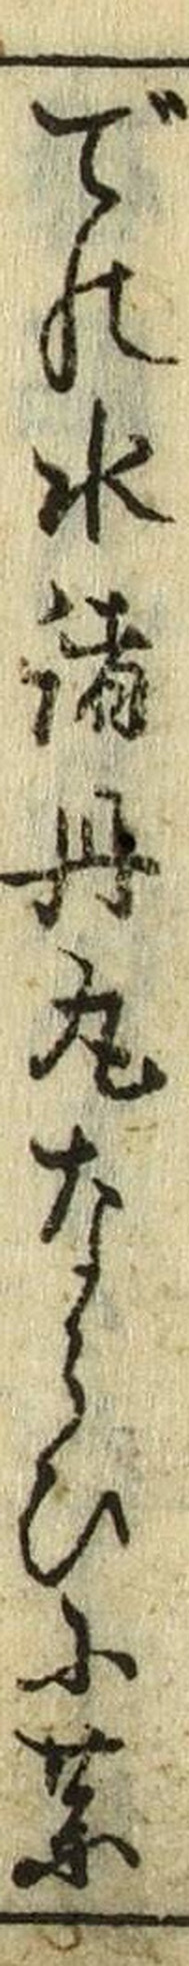での水諸丹丸ならひに薬
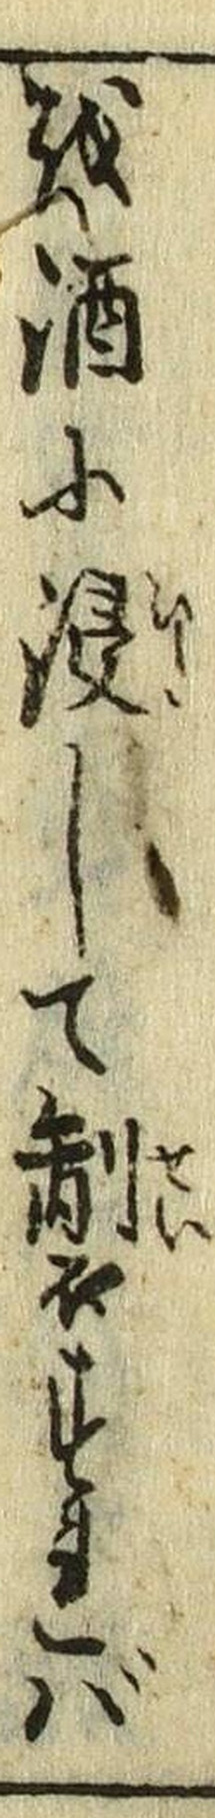を酒に浸して製すれば
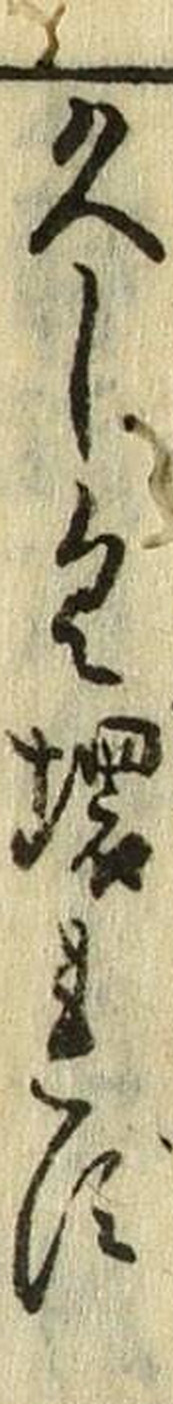久しく壊れず
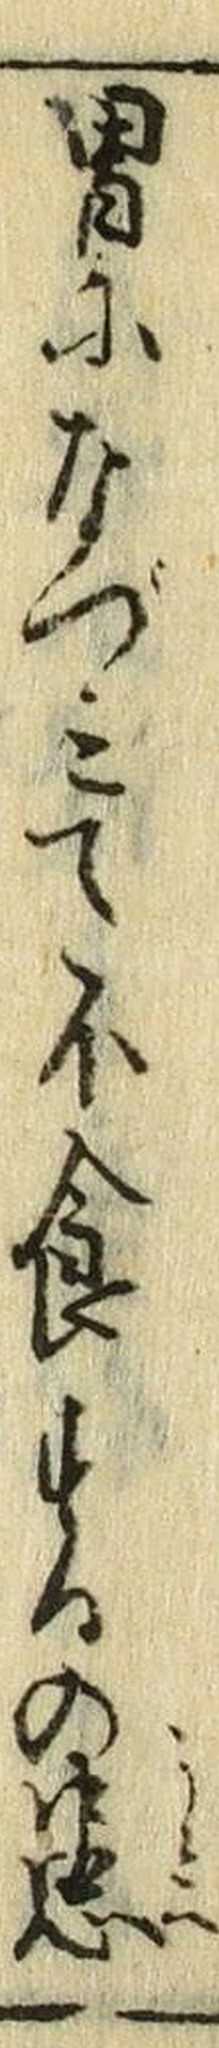胃になづみて不食するの患
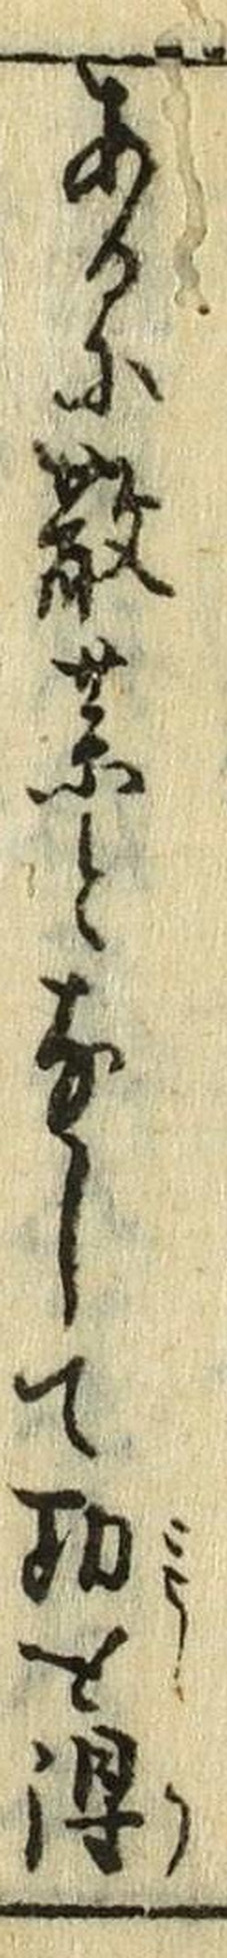あるに散薬となして功を得
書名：居家養生記
